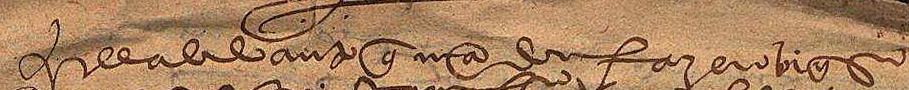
trellado do auto q̄ mādou fazer o vigro
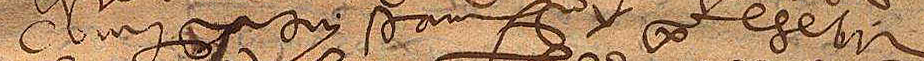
comtra trystam frco p̄o lhe vjr
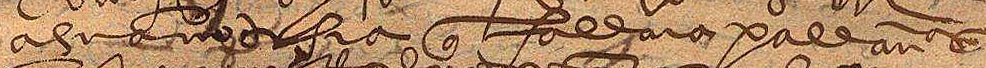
a sua notisia q̄ fallara pallauras
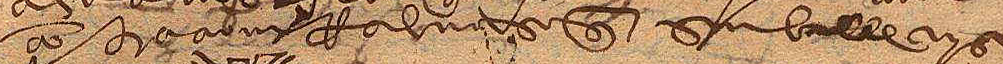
cōtra a omRa de noso s̄r sendo elle crys
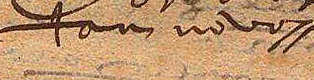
tam novo//
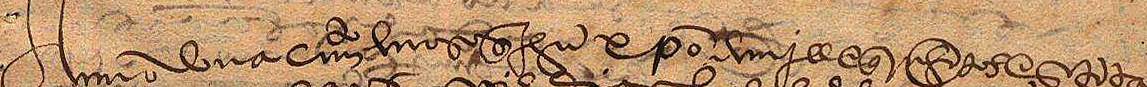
Anno do nacimeto de noso s̄ Jhū xpō de mjll e q̄jnhētos e setēta
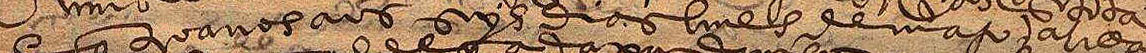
e q̄tro anos aos seys dias do mes de majo ē a villa
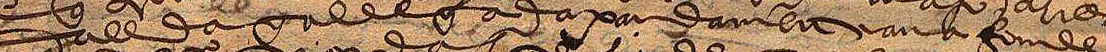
dallda gallega da par da merceana honde
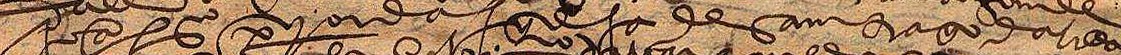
Joā Lço prjor da Jgreja de samtiago da villa
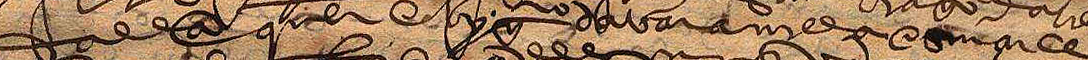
dallāquer e vygro da vara nella e seu arce
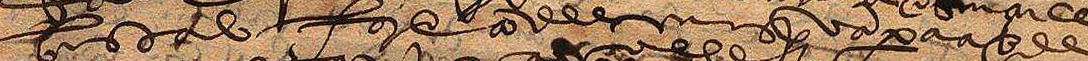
bistado foj e cō elle eu esp̄vā ꝑa aꝟ de
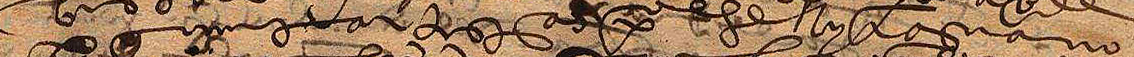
ꝑgumtar testas p̄o lhe vyr a sua no
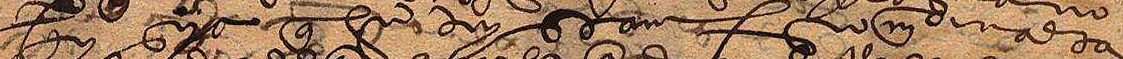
tysya q̄ hū trystam frco mor na dita
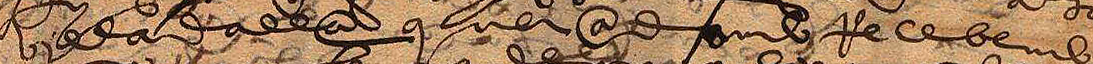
vjlla dallāquer ādando Recebendo
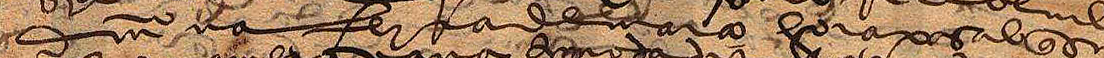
dinro na fejra de março hora pasado q̄ se
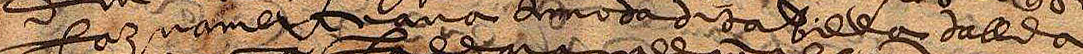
faz na merceana termo da dita villa dallda
